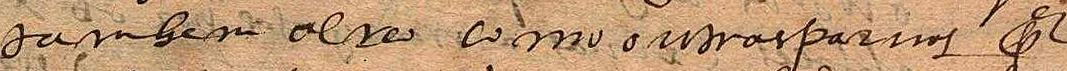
tambem o creo como outras paruas p̄er
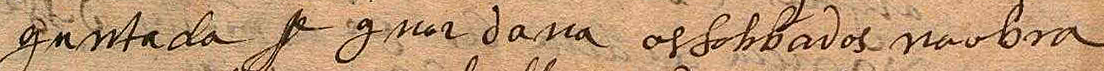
guntada se guardaua os sabbados na obra
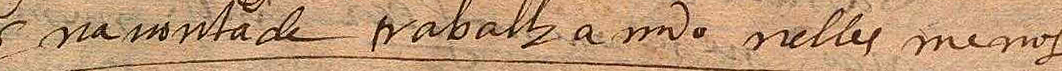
E na uontade trabalhamdo nelles menos
